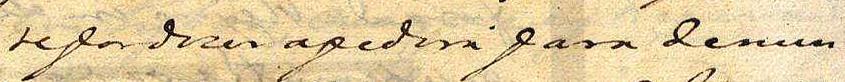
te por dizer a pedira para denun
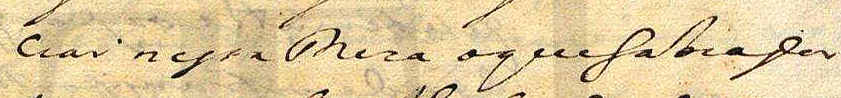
ciar nesta Meza o que sabia per
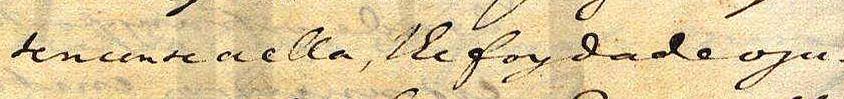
tencente a ella, lhe foy dado o ju
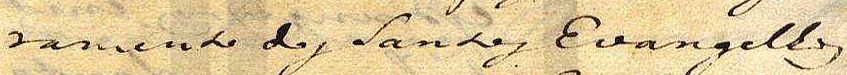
ramento dos Santos Evangelhos
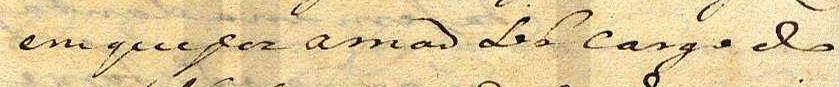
em que poz a maõ sob cargo do
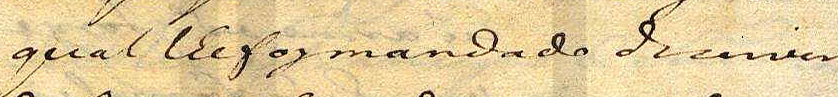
qual lhe foy mandado dizer ver
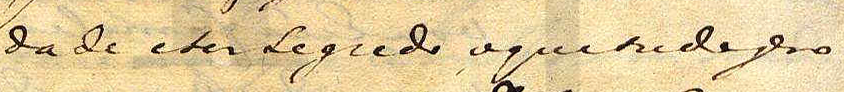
dade e ter Segredo, o que tudo pro
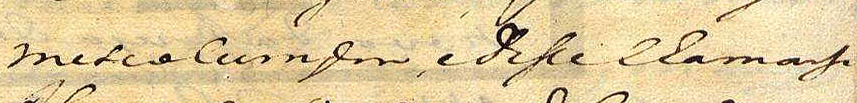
meteo Cumprir, e disse chamarse
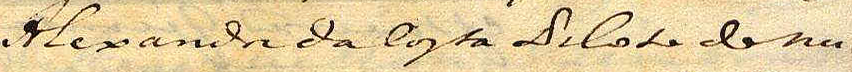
Alexandre da Costa Piloto do nu
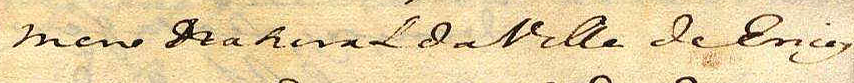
men natural da Villa de Ericey
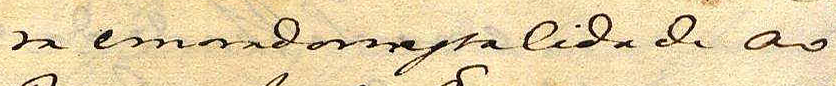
ra, e morador nesta Cidade ao
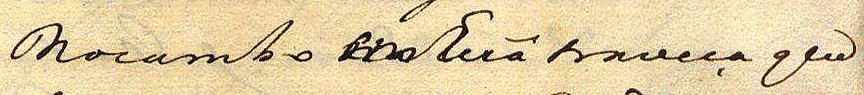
Mocambo em huā traveça que
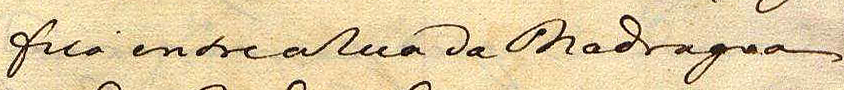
fica entre a Rua da Madragoa
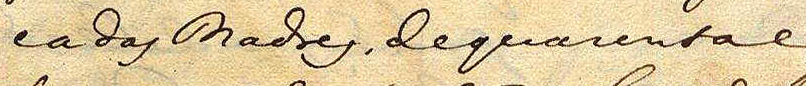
e a das Madres, de quarenta e
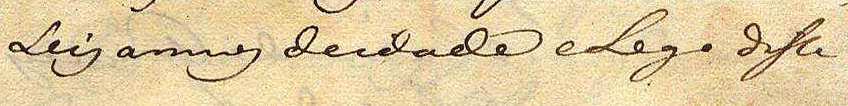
seis annos de idade e Logo disse
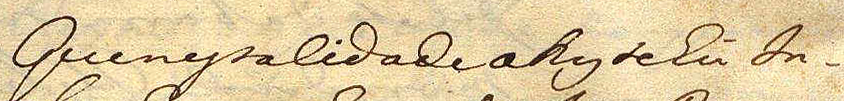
Que nesta cidade assiste hū In
